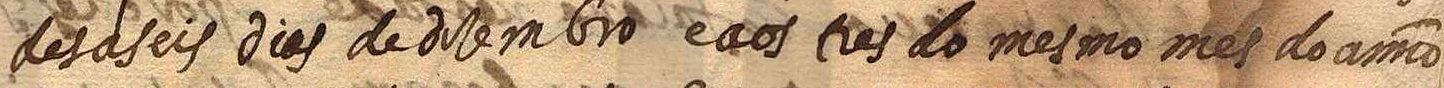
desaseis dias de dizembro e aos tres do mesmo mes do an̄no
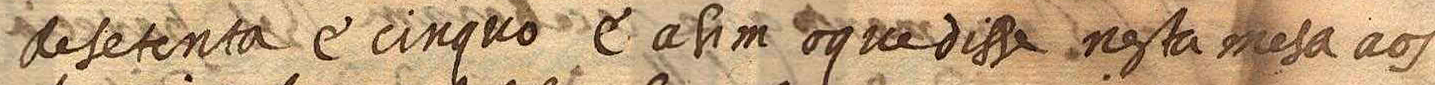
de setenta e cinquo e asim o que disse nesta mesa aos
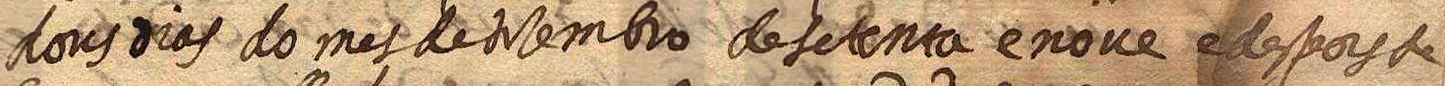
dous dias do mes de dizembro de setenta e noue e despois de
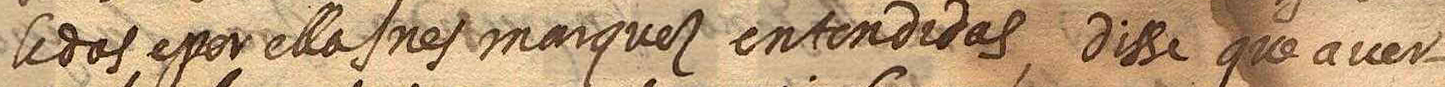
lidas e por ella Ines marquez entendidas, disse que a uer
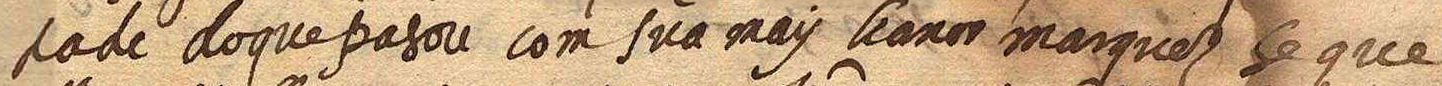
dade do que pasou com sua may lianor marquez he que
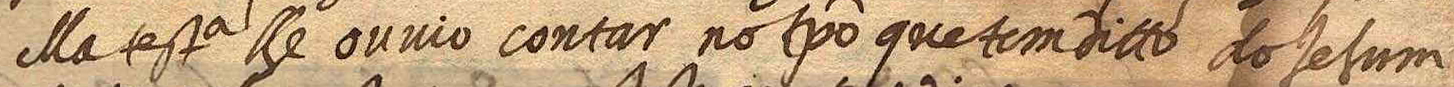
ella testa lhe ouuio contar no tp̄o que tem ditto do JeJum
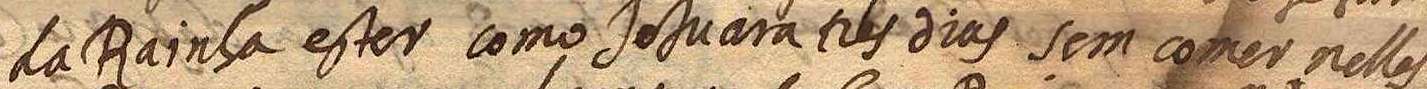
da Rainha ester como JeJuara tres dias sem comer nelles
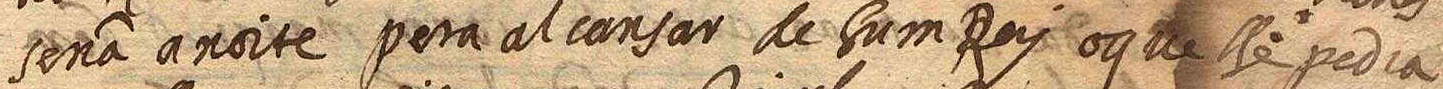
senā a noite pera alcansar de hum Rey o que lhe pedia
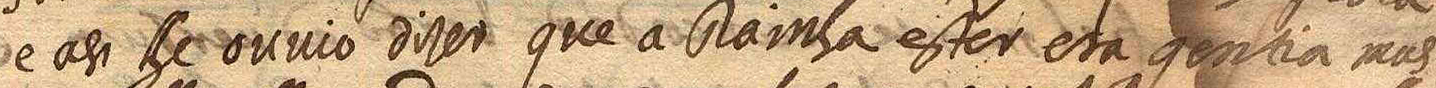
e asi lhe ouuio dizer que a Rainha ester era gentia mas
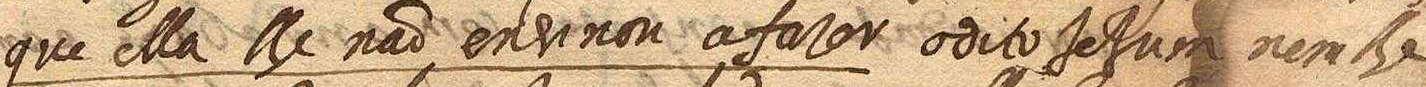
que ella lhe não ensinou a fazer o dito JeJum nem lhe
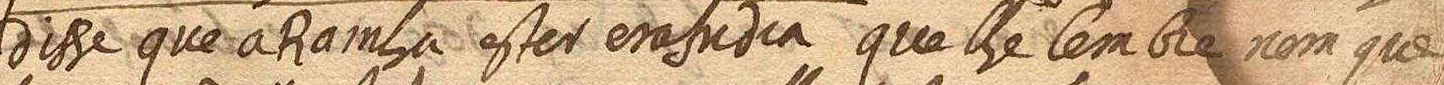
disse que a Rainha ester era Judia que lhe lembre nem que
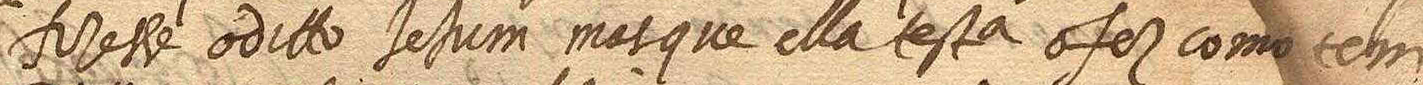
fizesse o ditto JeJum mas que ella testa o fez como tem
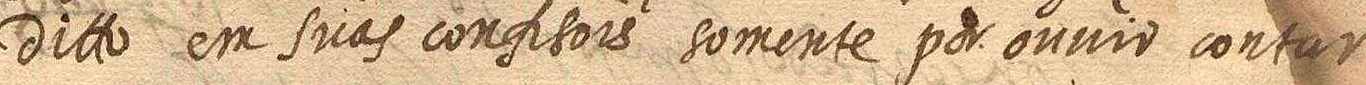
ditto em suas confisois somente por ouuir contar
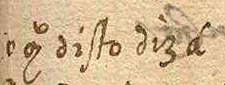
o q̄ disto diz á
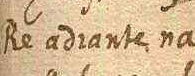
Re adiante na
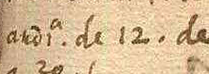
audia. de 12. de
